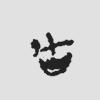居
